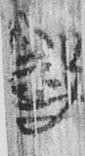{少言戈}（察）
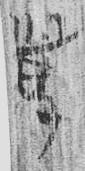{鼠一}（一）
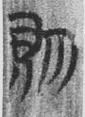則
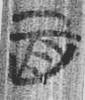百
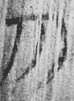勿（物）
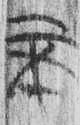不
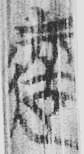○（失）
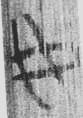女（如）
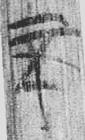不
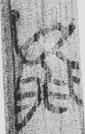能
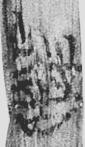○（察）
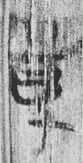○（一）
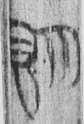則
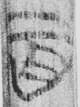百
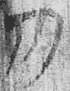勿（物）
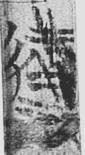○（失）
